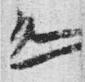亡（无）
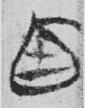○（攸）
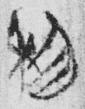利
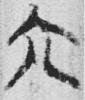六
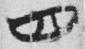四
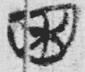困
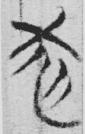○（蒙）
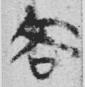吝
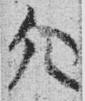六
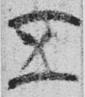五
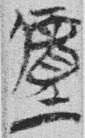僮（童）
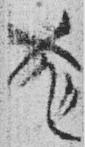○（蒙）
